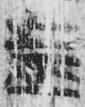者
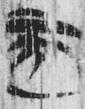而
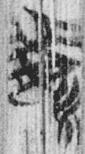緐（繁）
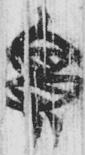實
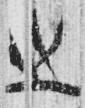之
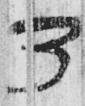乃
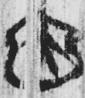因
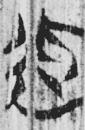迡
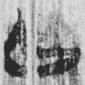㠯（以）
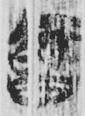智（知）
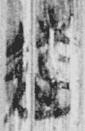遠
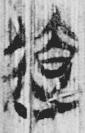迲（去）
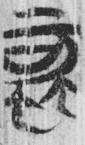○（苛）
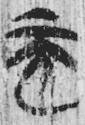而
